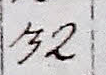32
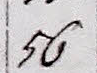56
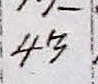43
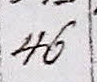46
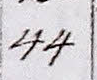44
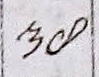38
